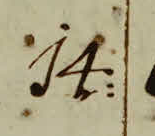14:
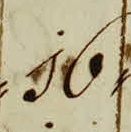16
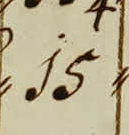15
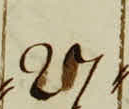27
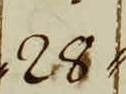28
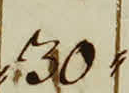30
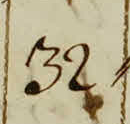32
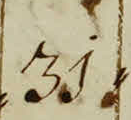31
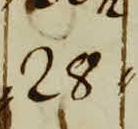28
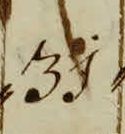31
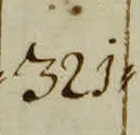321
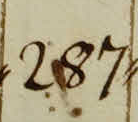287
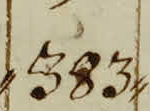383
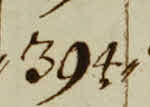394
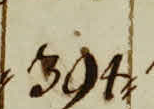394
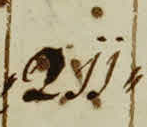211
